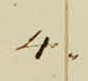4
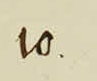10.
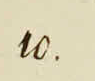10.
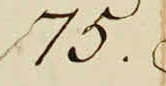75.
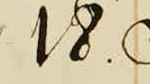18.
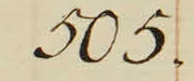505
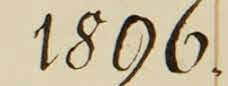1896
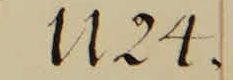1124
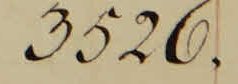3526
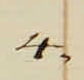4
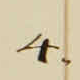4
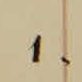1
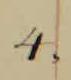4
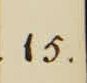15
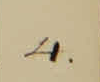4.
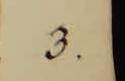3.
